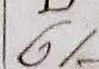61
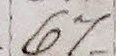67
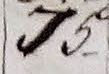75
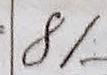81
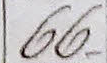66
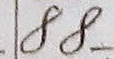88
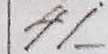41
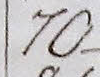70
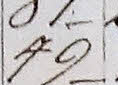49
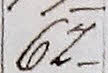62
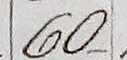60
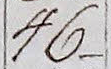46
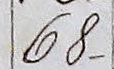68
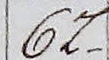62
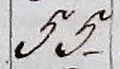55
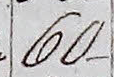60
